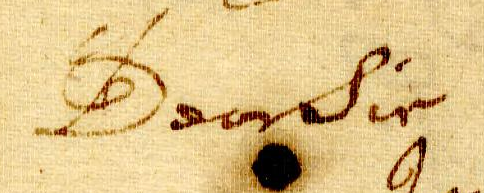Dear Sir
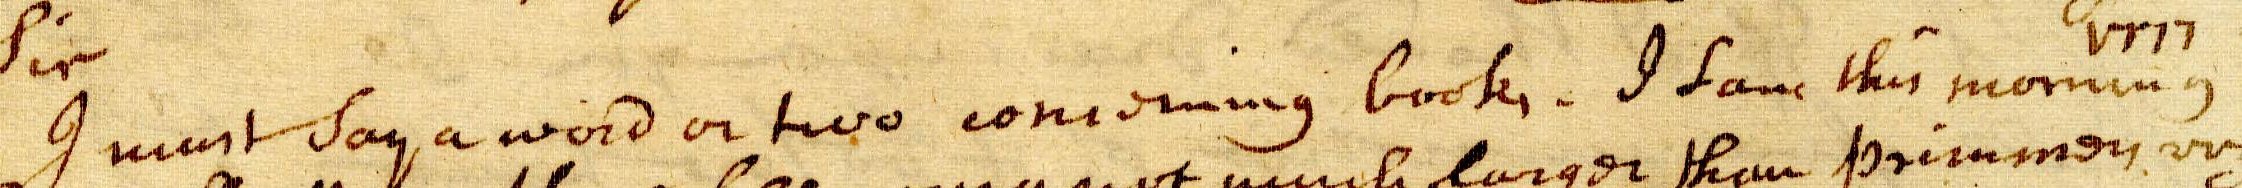I must Say a word or two concerning books. I saw this morning
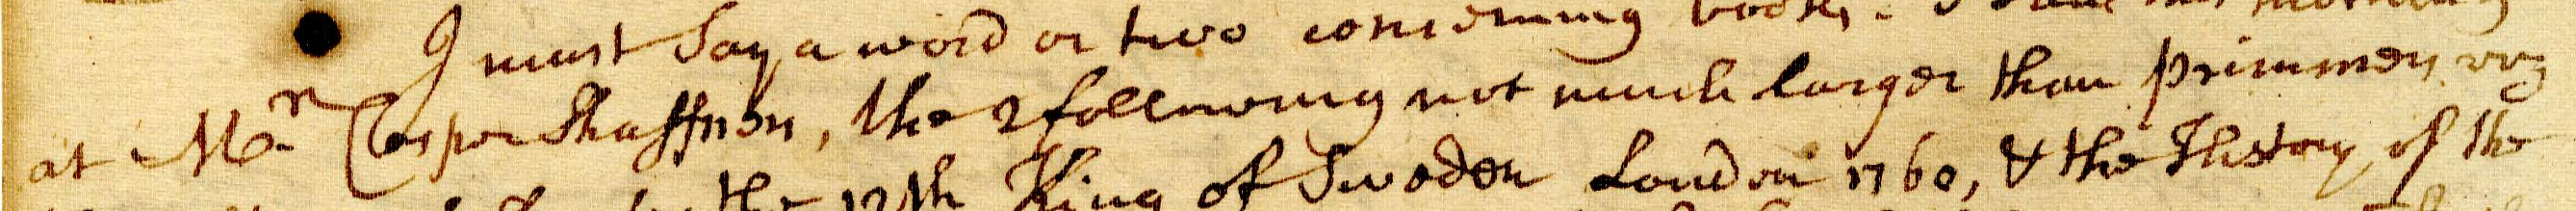at M^r. Casper Shaffnor, the 2 following not much larger than primmer viz
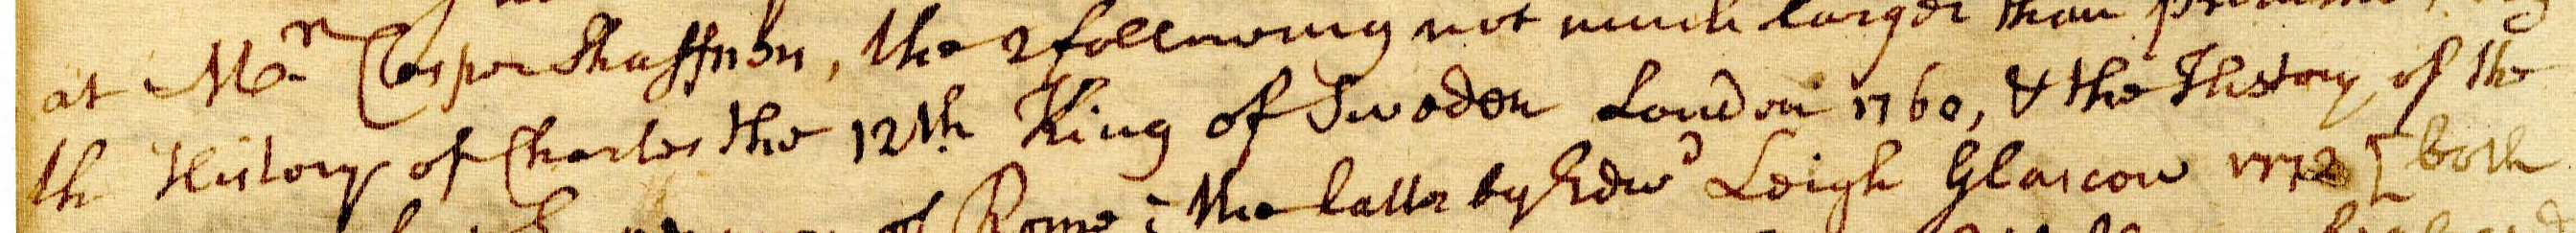th History of Charles the 12^th King of Sweden London 1760, & the History of the
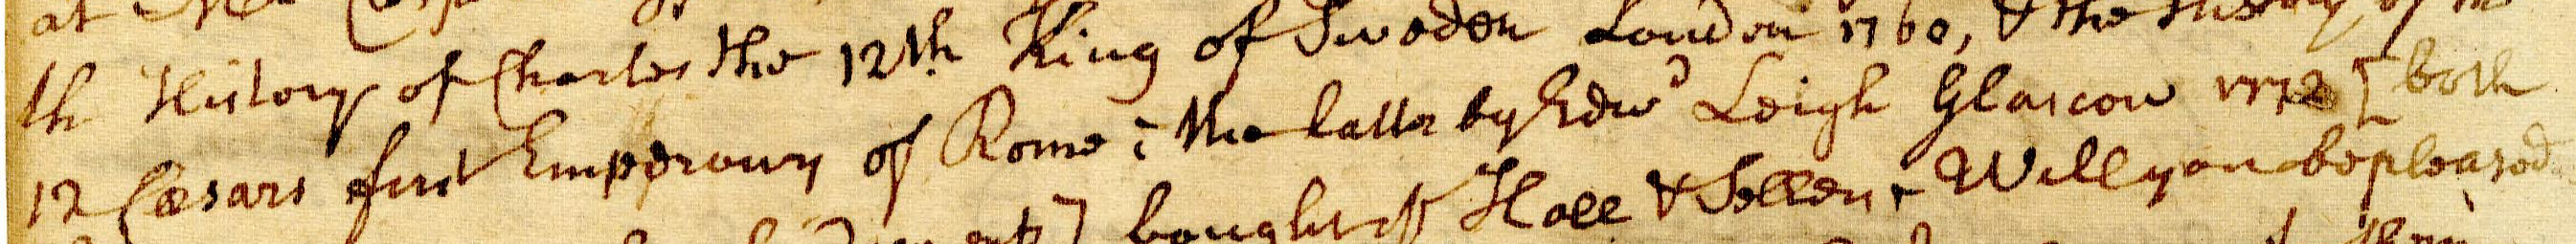12 Cesars first Emporers of Rome; the Latter by Edw^d Leigh Glascow 1772 [both
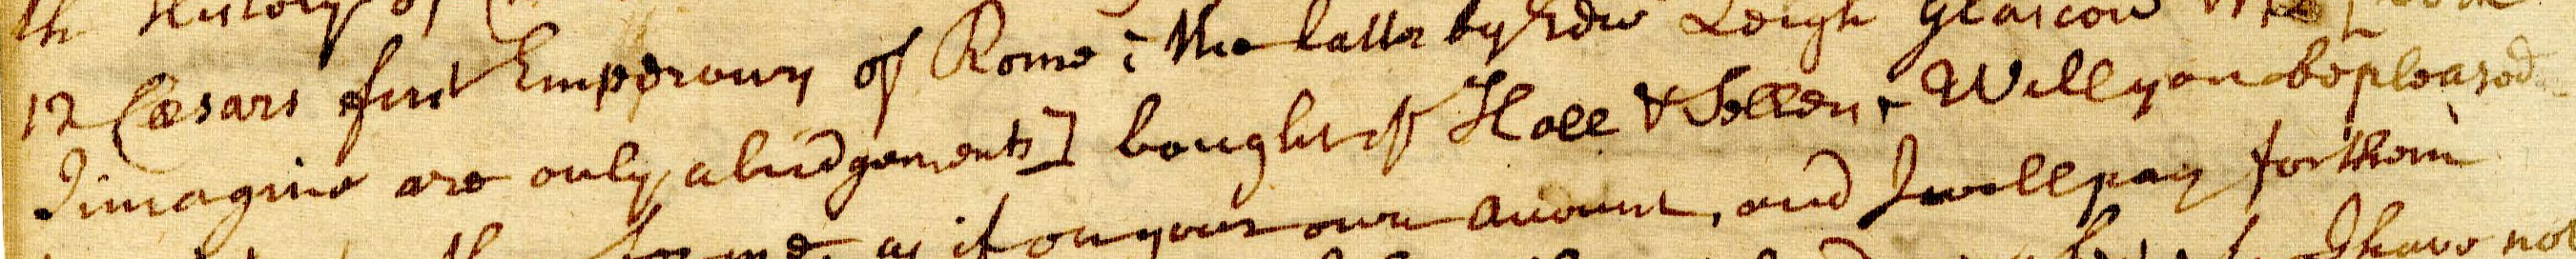I imagine are only abridgements] bought of Hall & Sellers, Will you be pleased
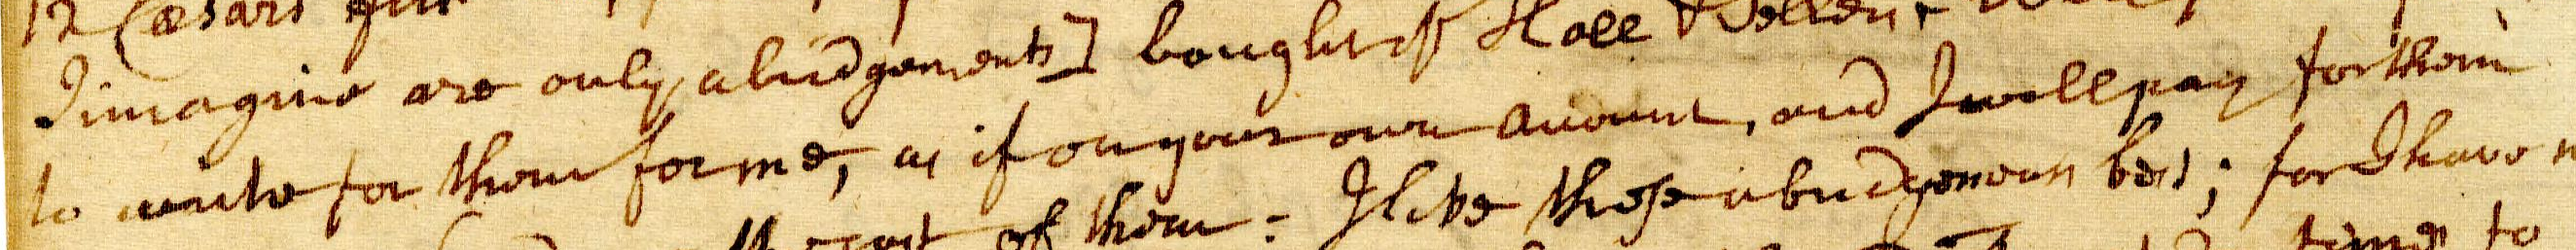to write for there for me, as if on your own account, and I will pay for them
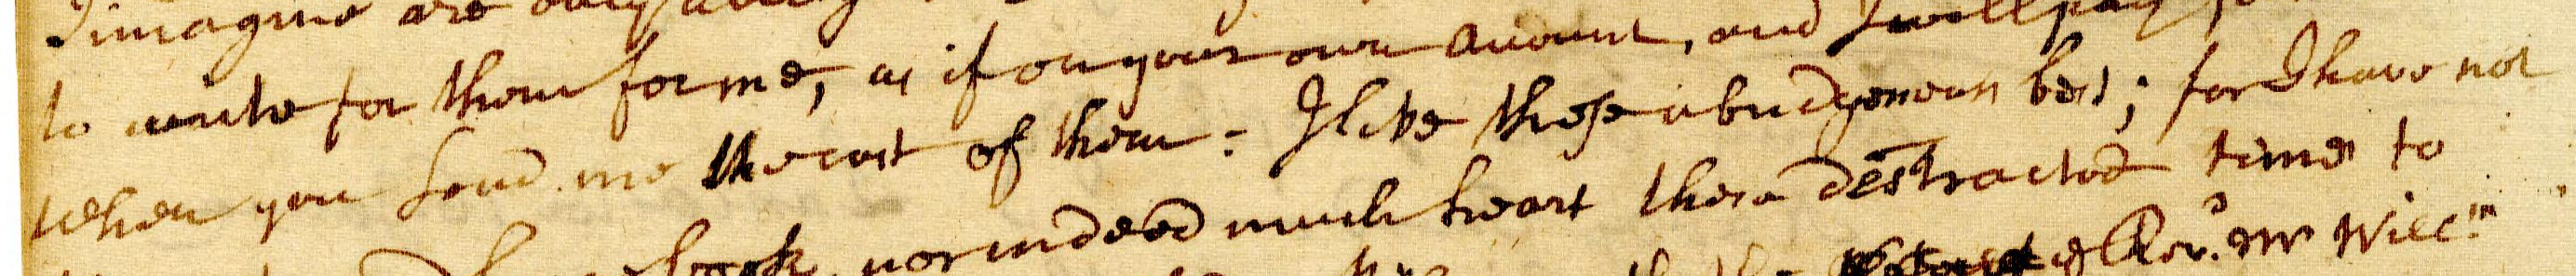When you send me the cost of them. I like these abridgements best; for I have not
